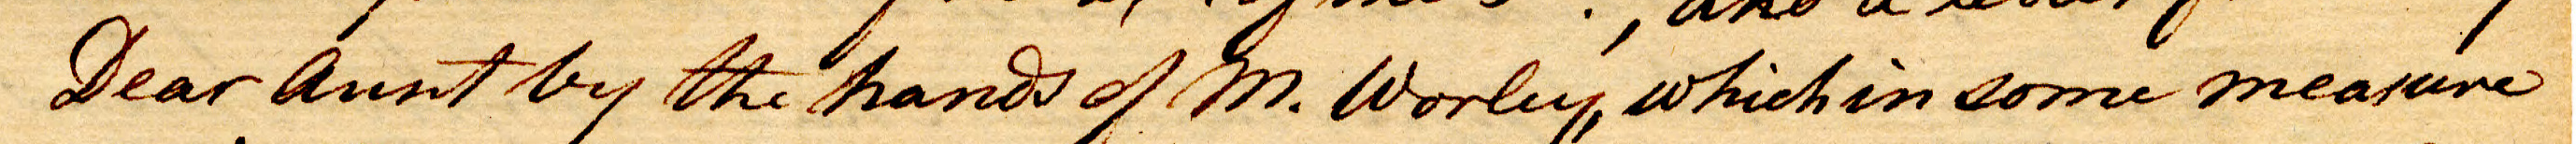Dear Aunt by the hands of M. Worley, which in some measure
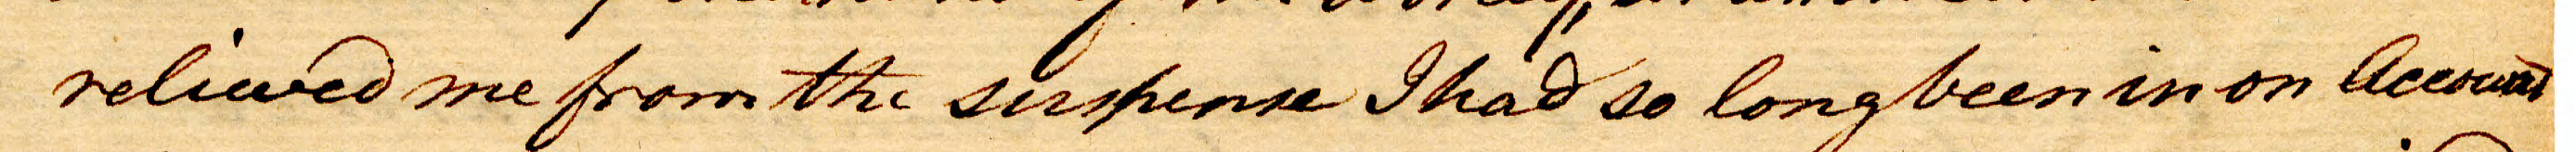relieved me from the suspense I had so long been in on Account
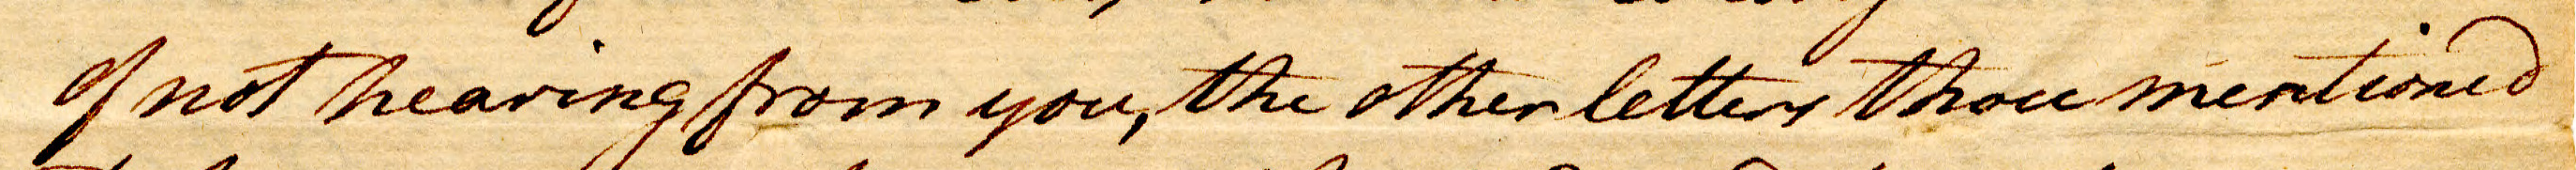of not hearing from you, the other letters thou mentioned
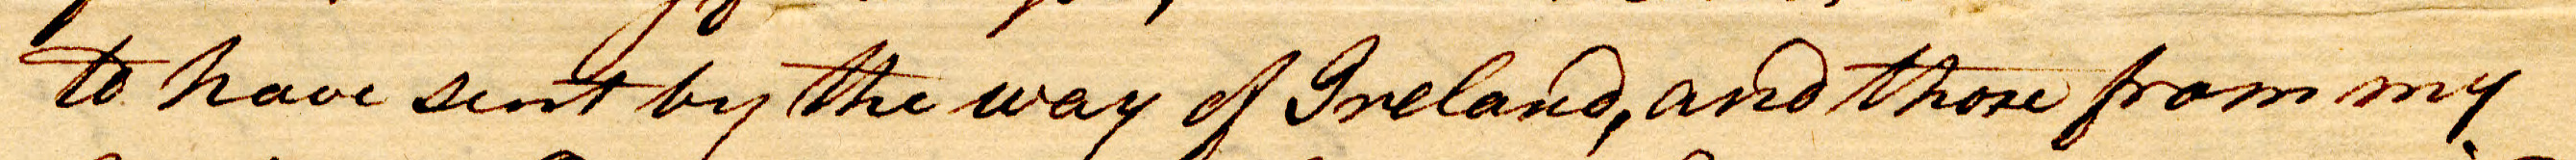to have sent by the way of Ireland, and those from my
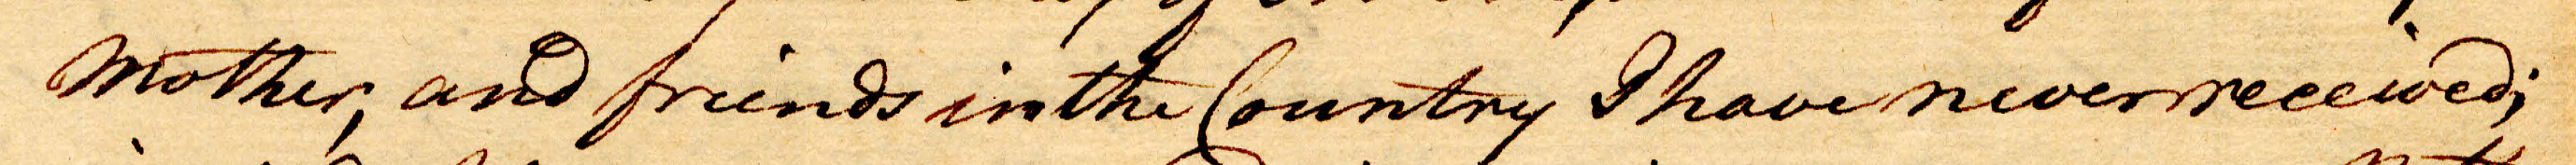Mother, and friends in the Country I have never received;
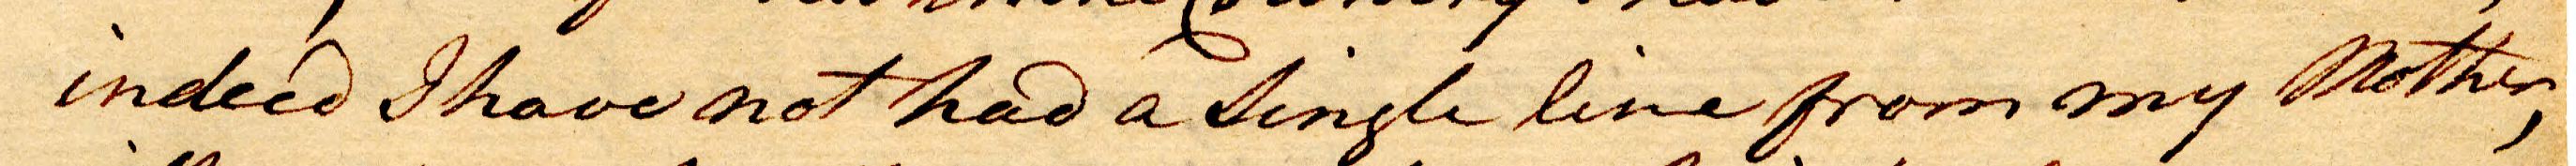indeed I have not had a Single line from my Mother,
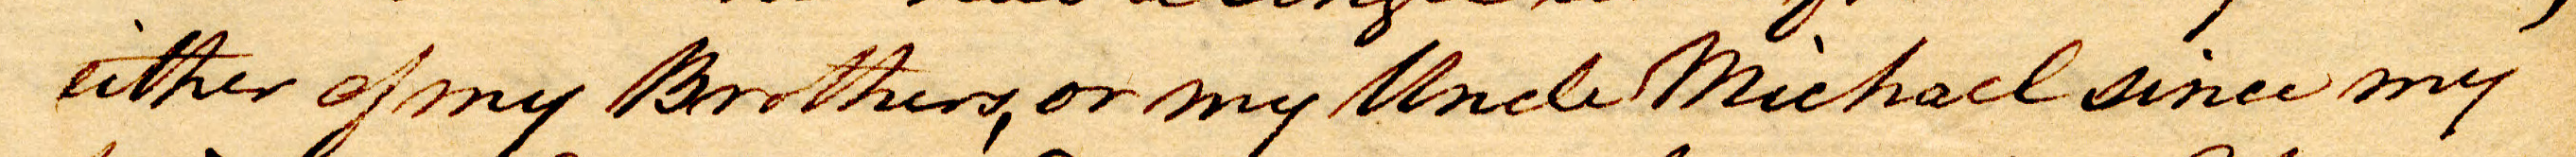either of my Brothers, or my Uncle Michael since my
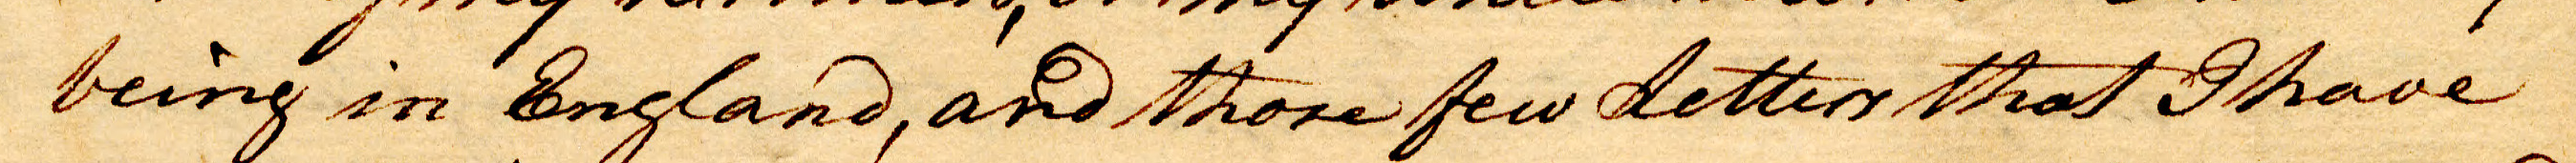being in England, and those few Letters that I have
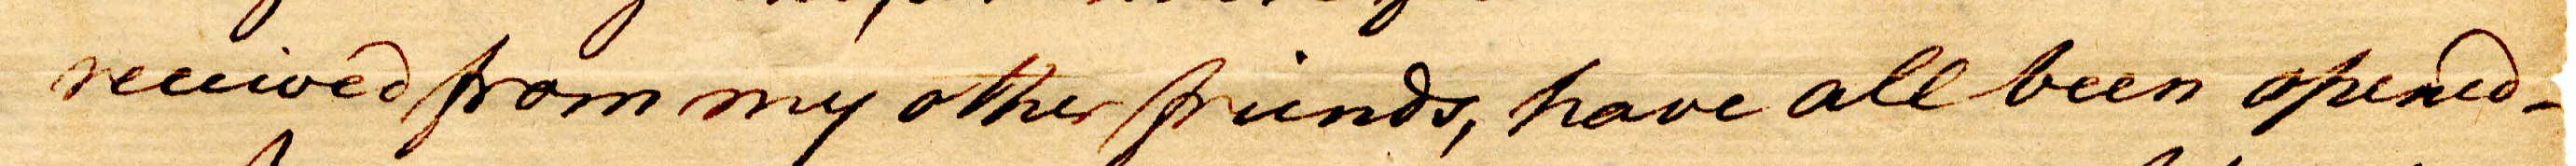received from my other friends, have all been opened-
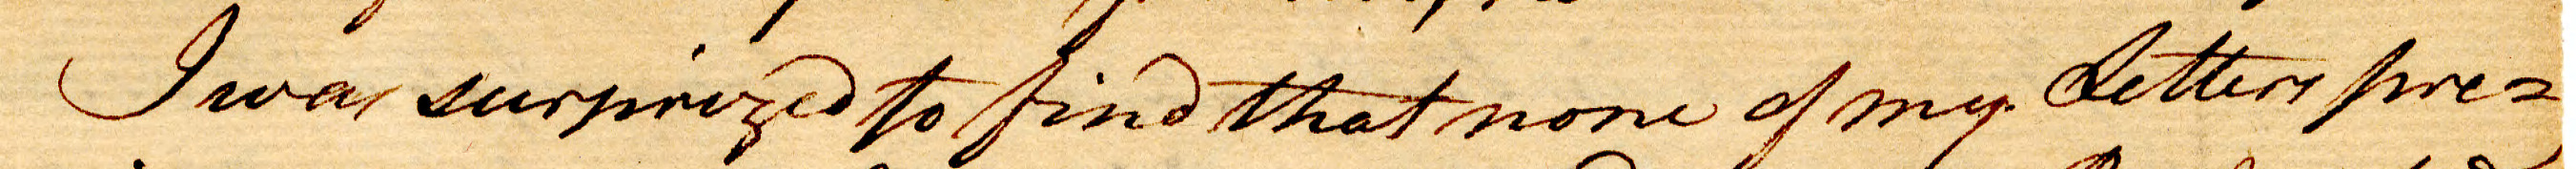I was surprized to find that none of my Letters pre-
